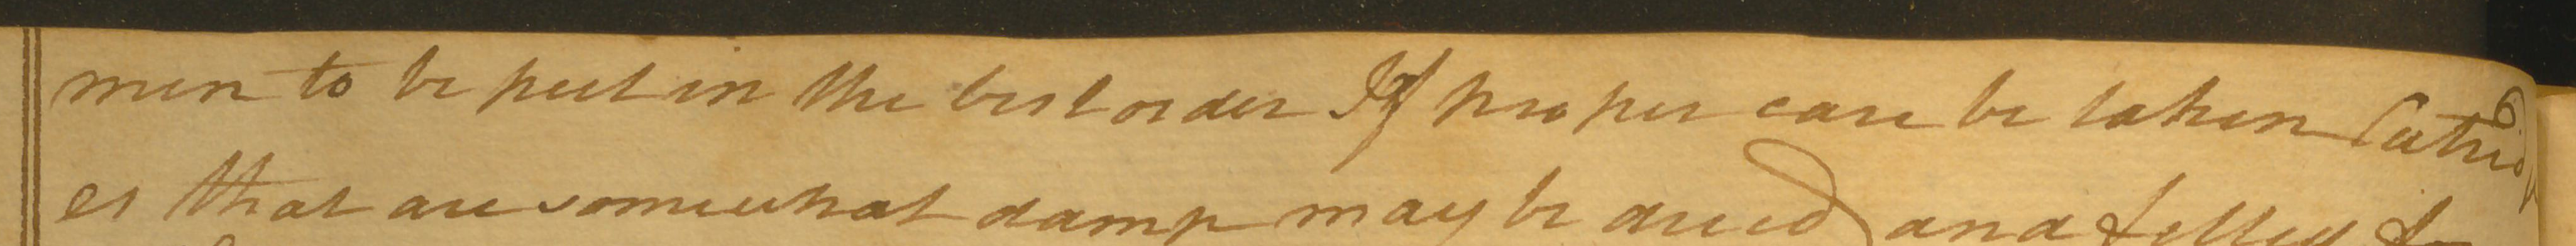men to be put in the best order If proper care be taken cartridg
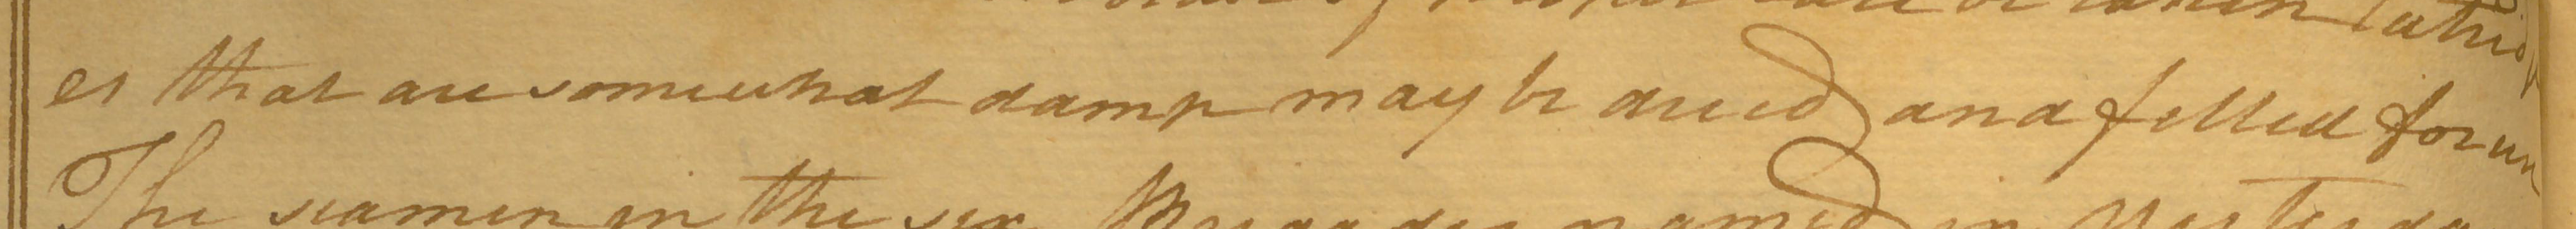es that are somewhat damp may be dried and fitted for use
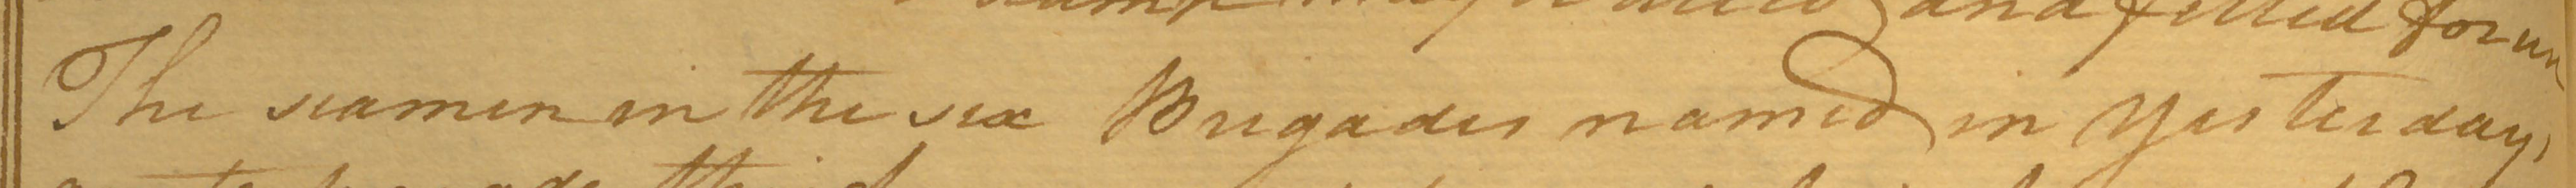The seamen in the six Brigades named in yesterdays
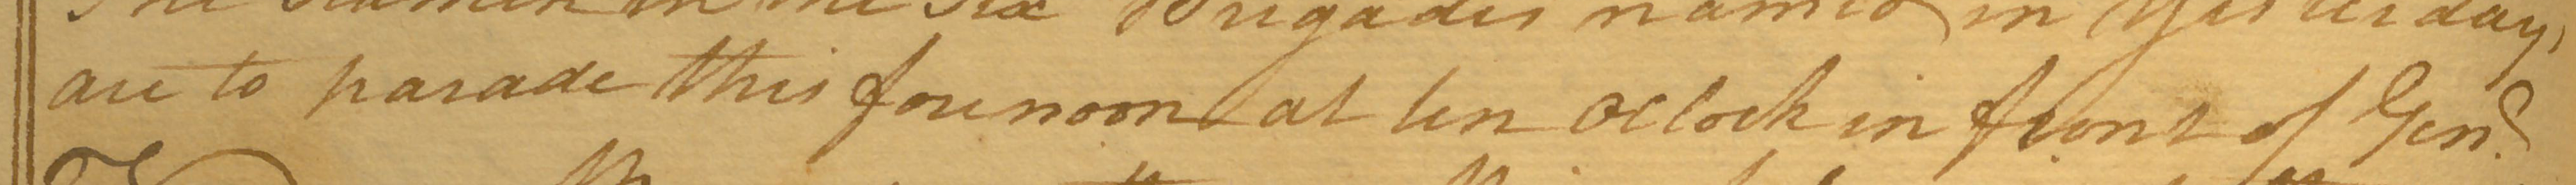are to parade this forenoon at ten OClock in front of Gen^l.
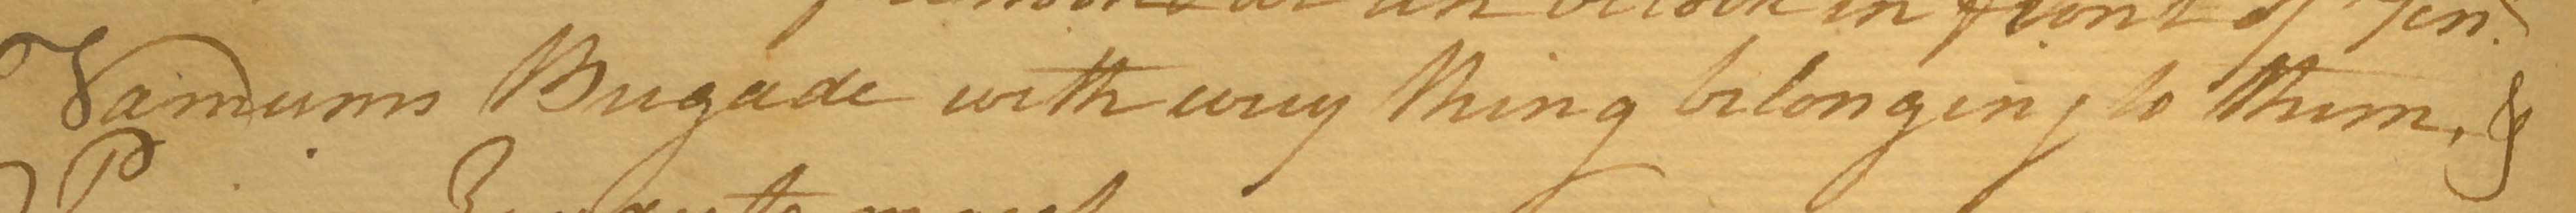Varnums Brigade with every thing belonging to them, &
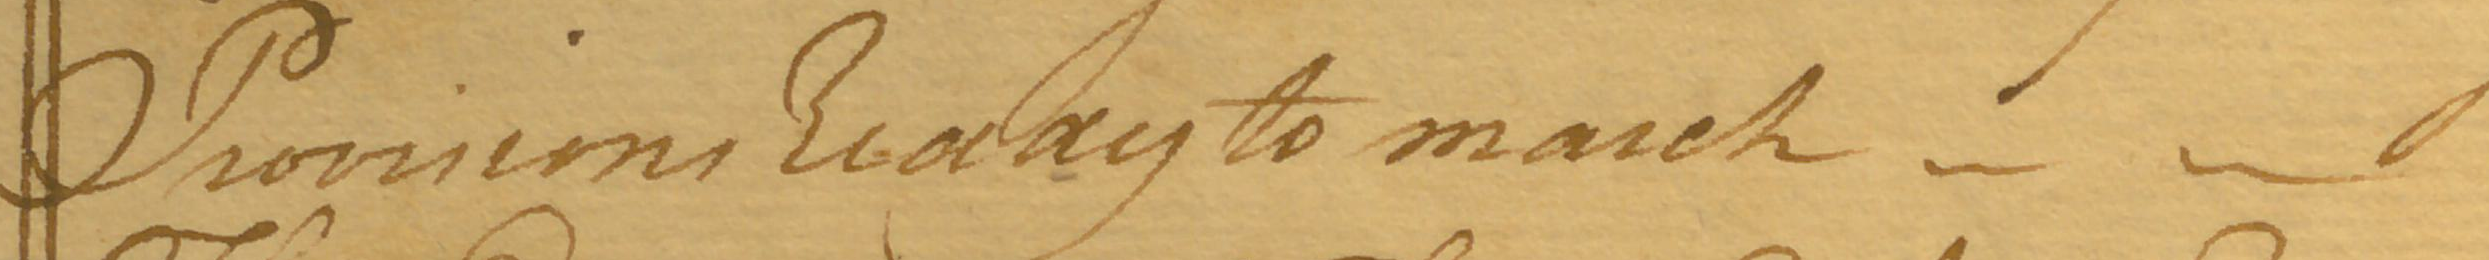Provisions ready to march- -
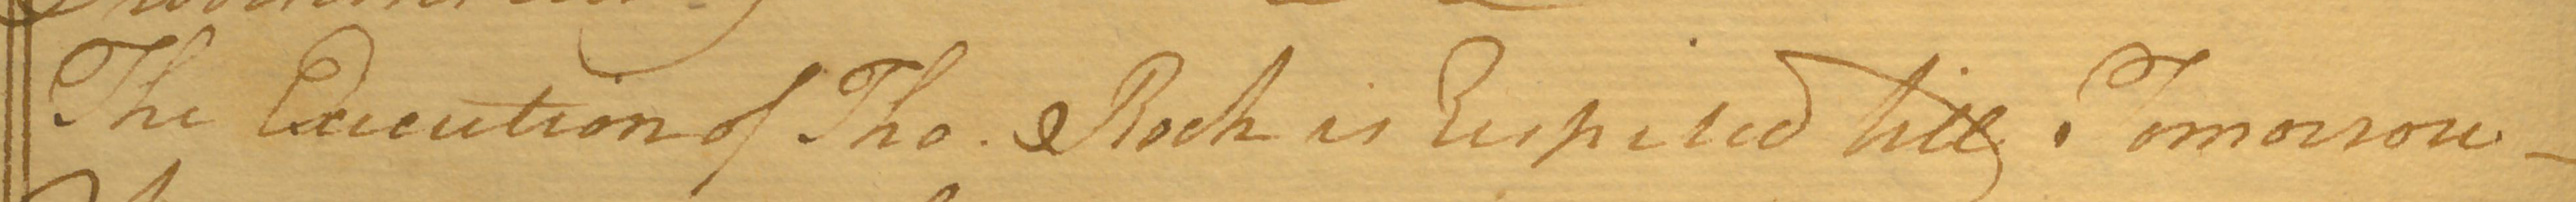The Execution of Tho. Rock is Expected till Tomorrow-
